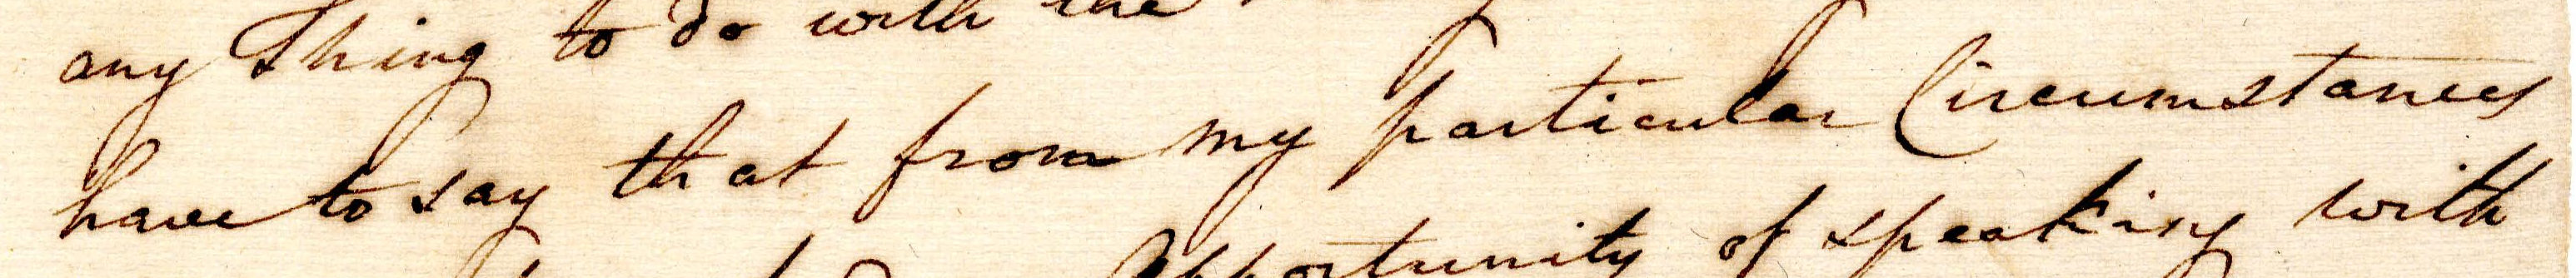have to say that from my particular Circumstances
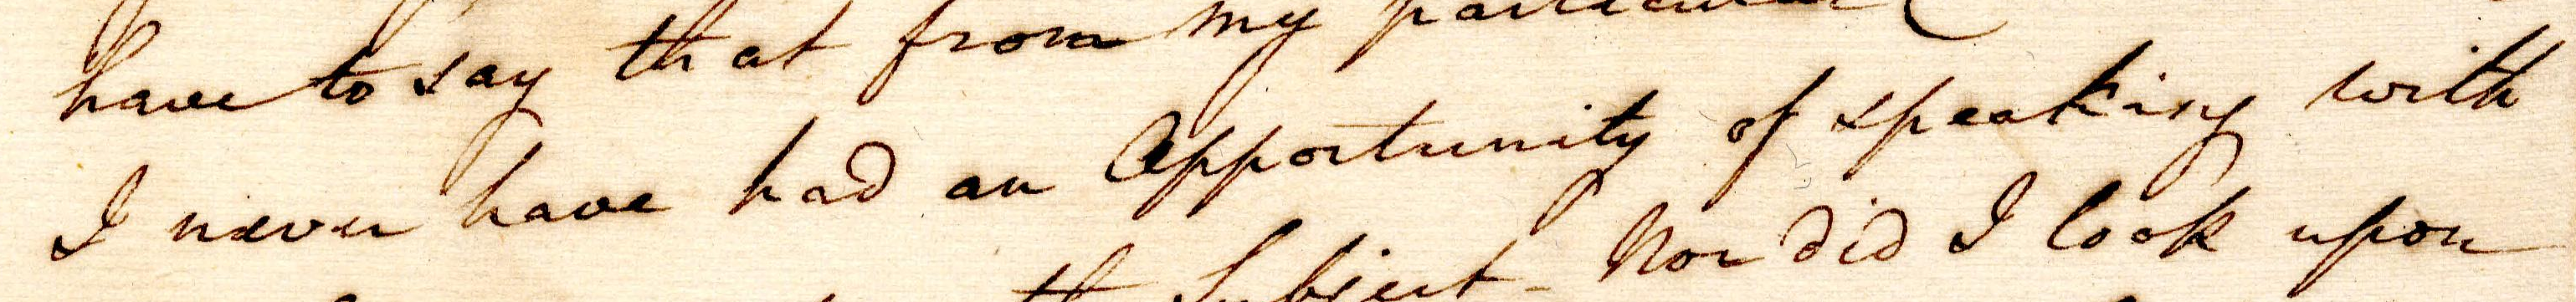I never have had an Opportunity of speaking with
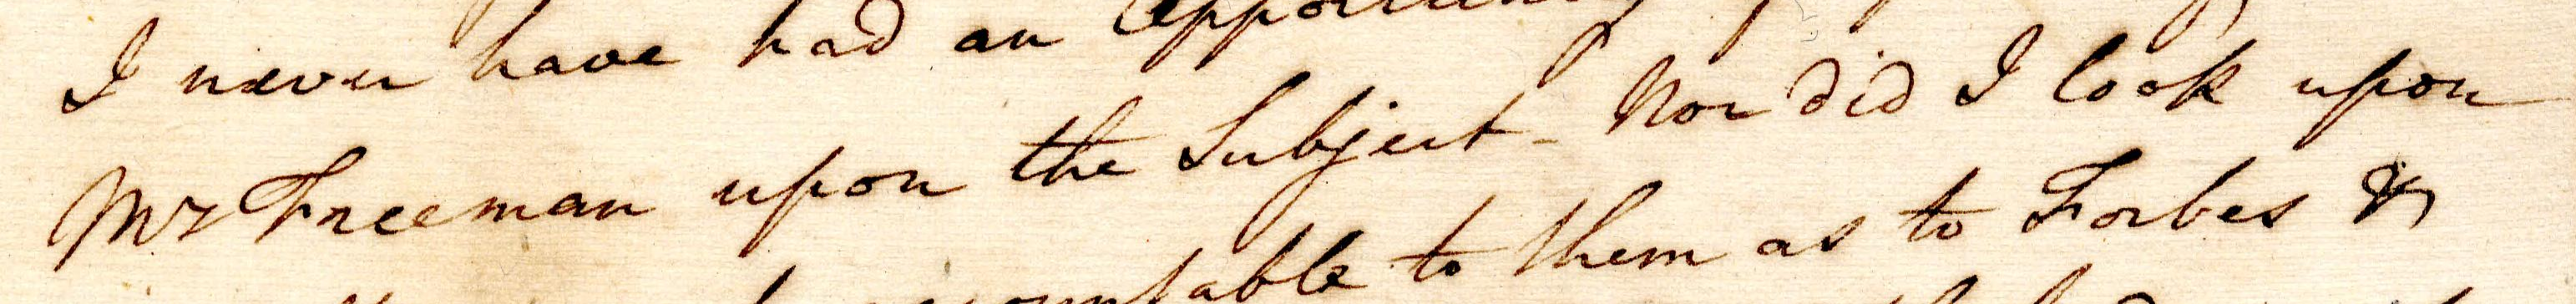M^r Freeman upon the Subject- Nor did I look upon
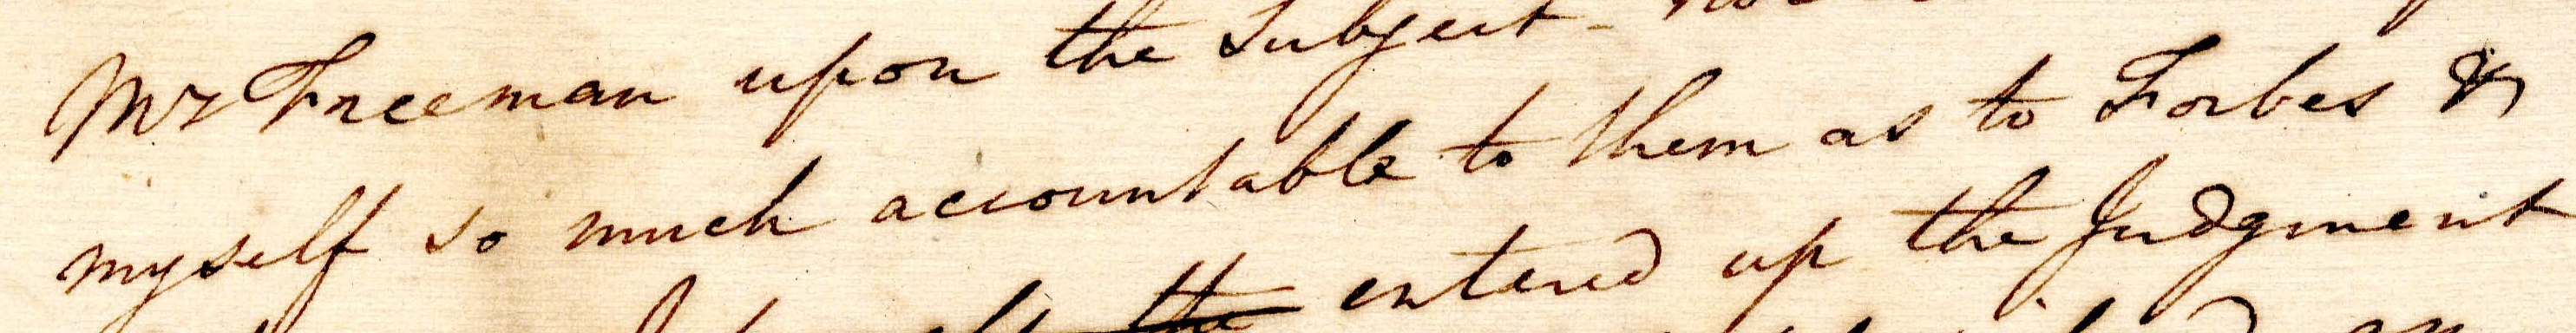myself so much accountable to them as to Forbes &
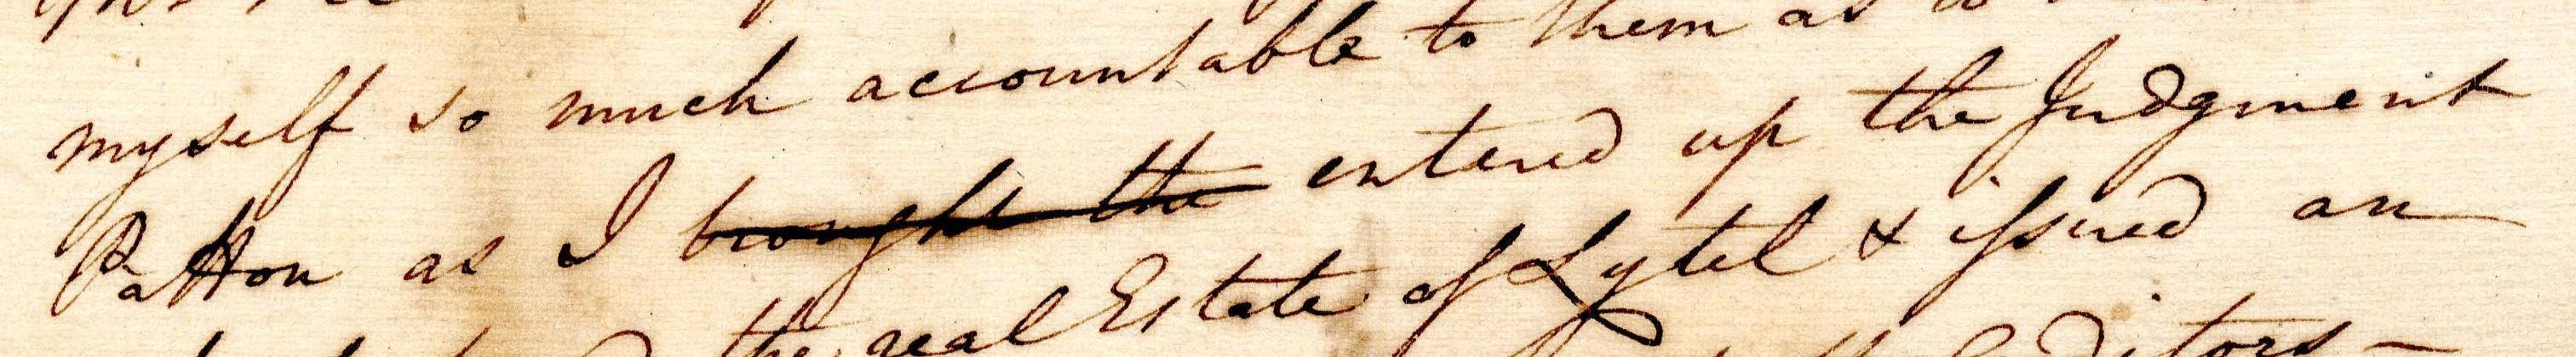Patton as I brought the entered up the Judgment
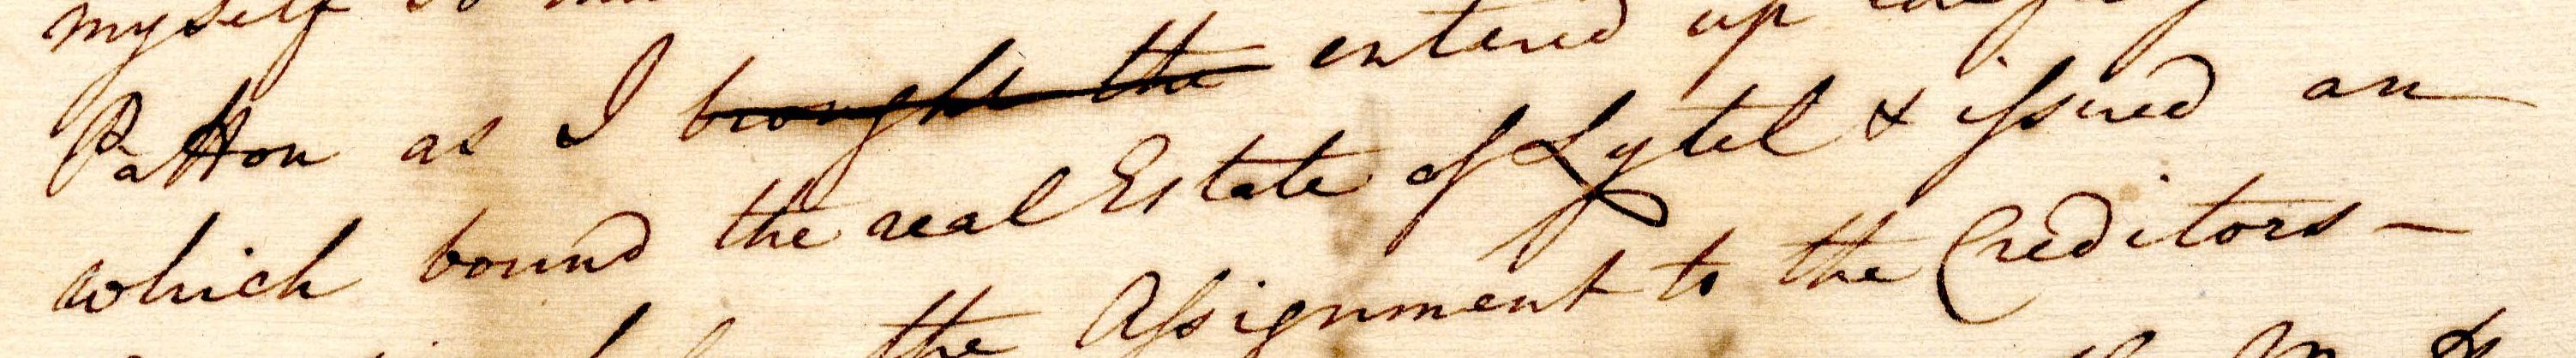which bound the real Estate of Lytel & issued an
